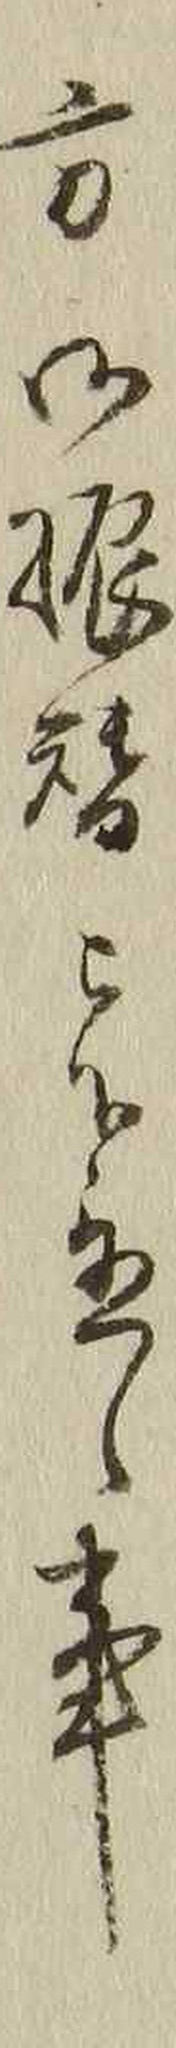方御振替被下置候事
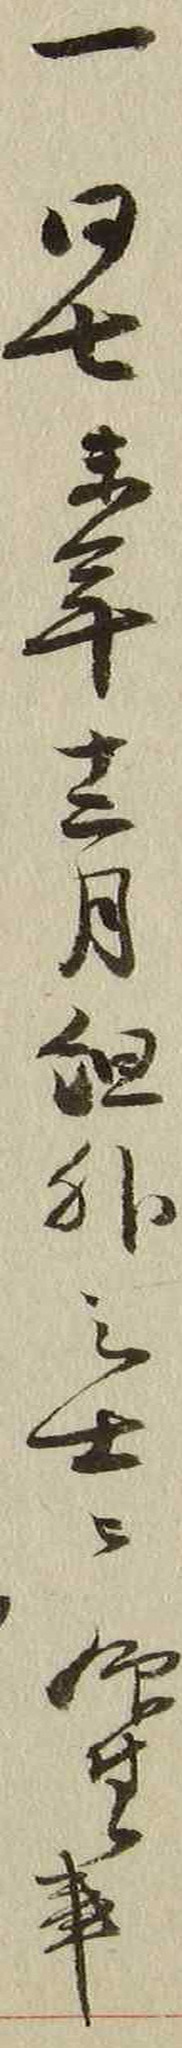一同七未年十二月組外之士被仰付候事
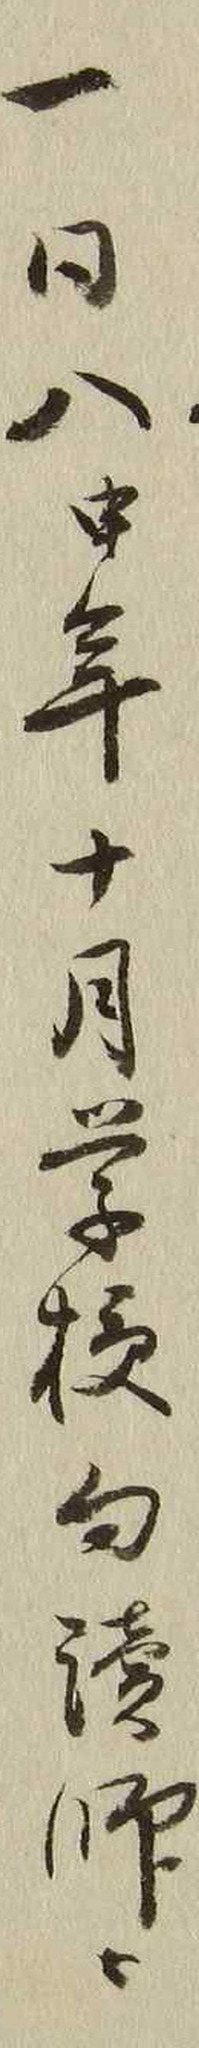一同八申年十月学校句読師被
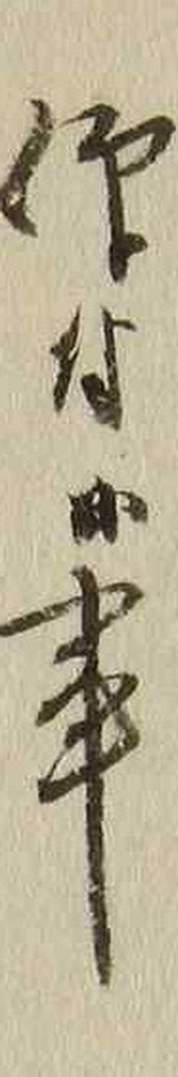仰付候事
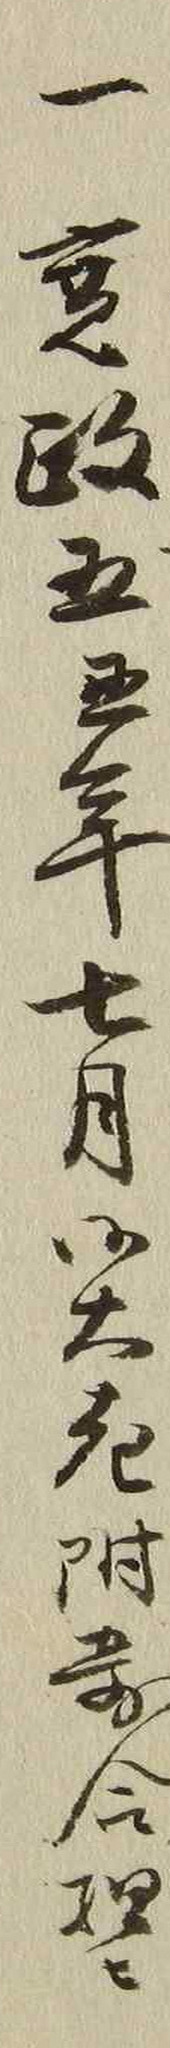一寛政五丑年七月御大老附寄合組被
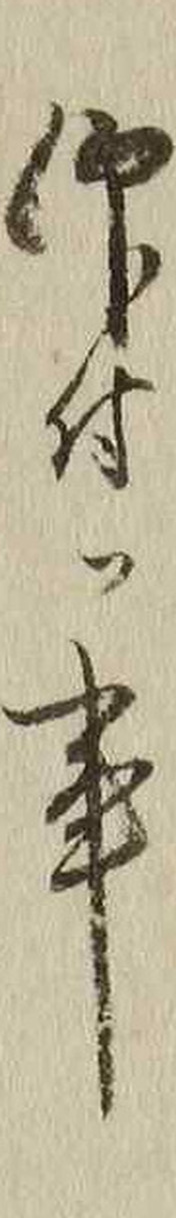仰付候事
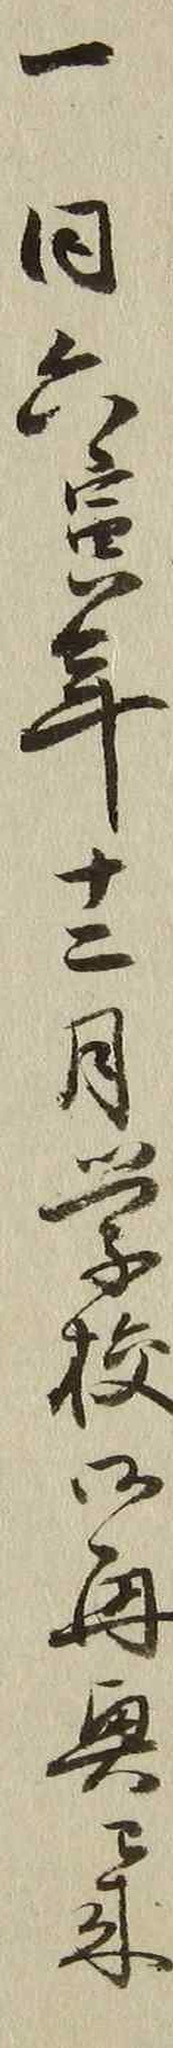一同六寅年十二月学校御再興被成
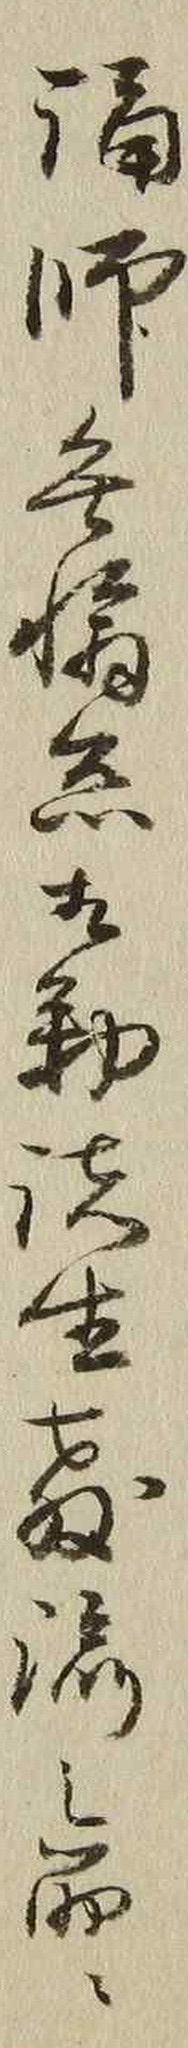誦師無懈怠相勤諸生教流之筋ニ
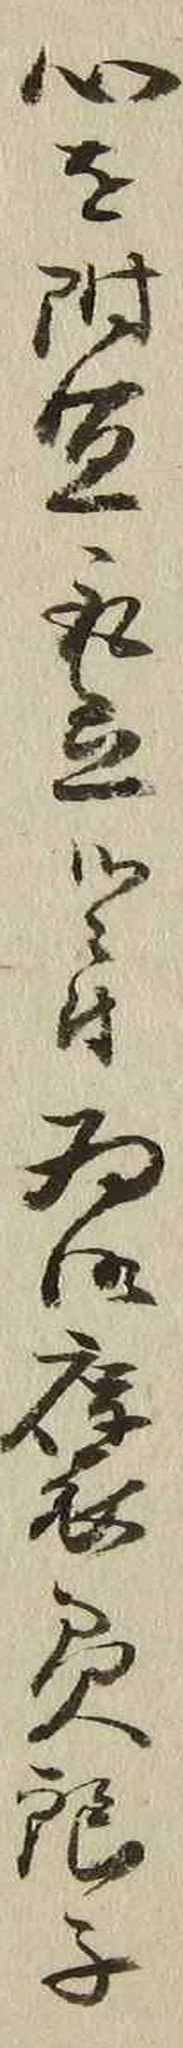心を附宜取立候ニ付為御褒美銀子
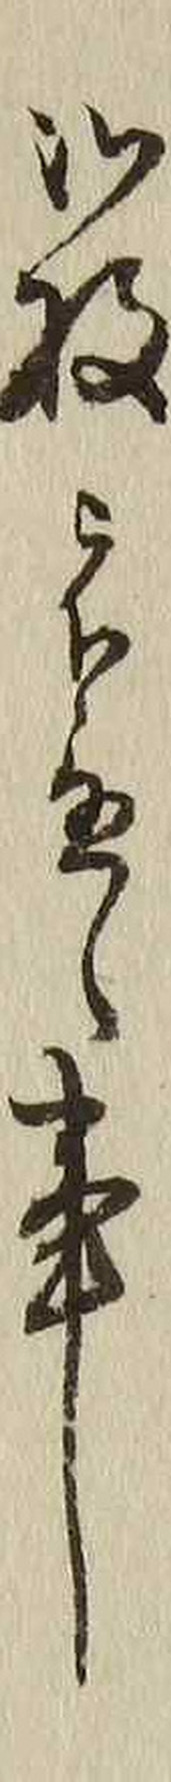弐枚被下置候事
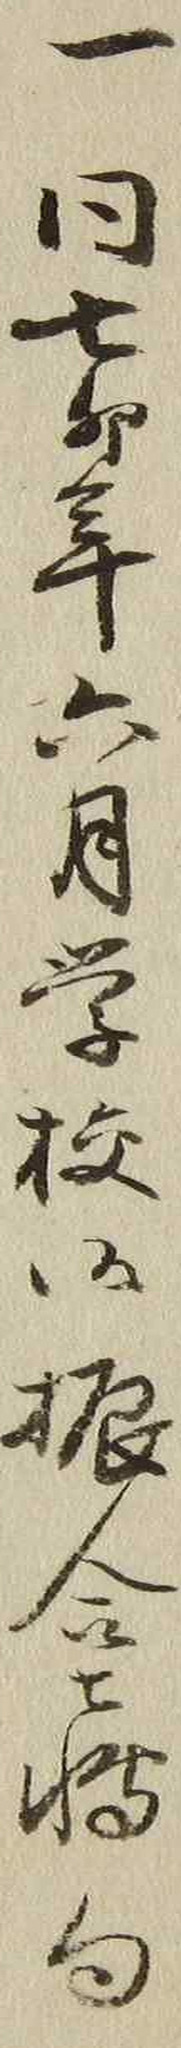一同七卯年六月学校御振合被転句
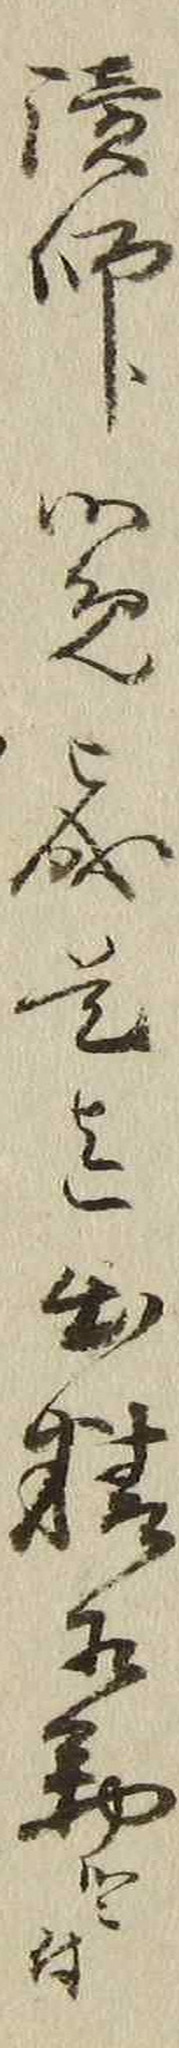読師御免被成是迄出精相勤候ニ付
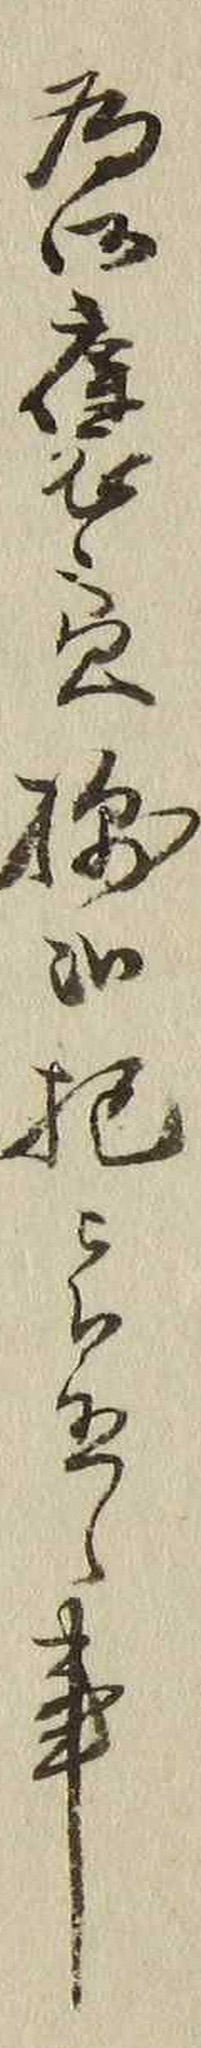為御褒美綿弐把被下置候事
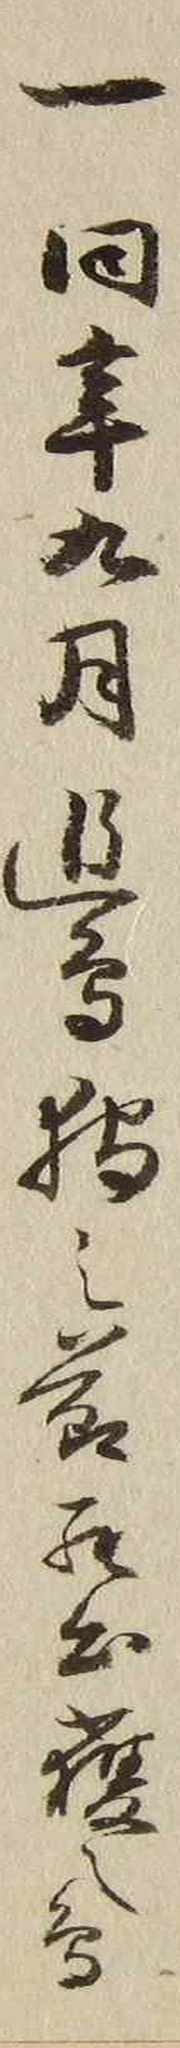一同年九月追鳥狩之節罷出獲之鳥
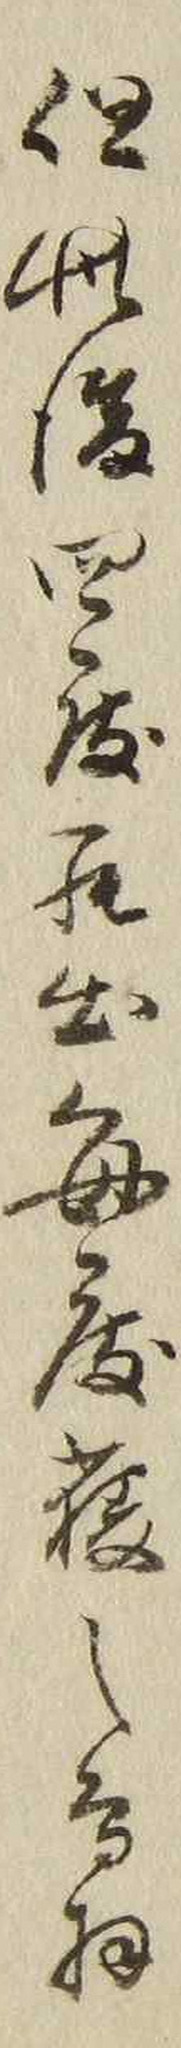但此後四度罷出毎度獲之鳥拝

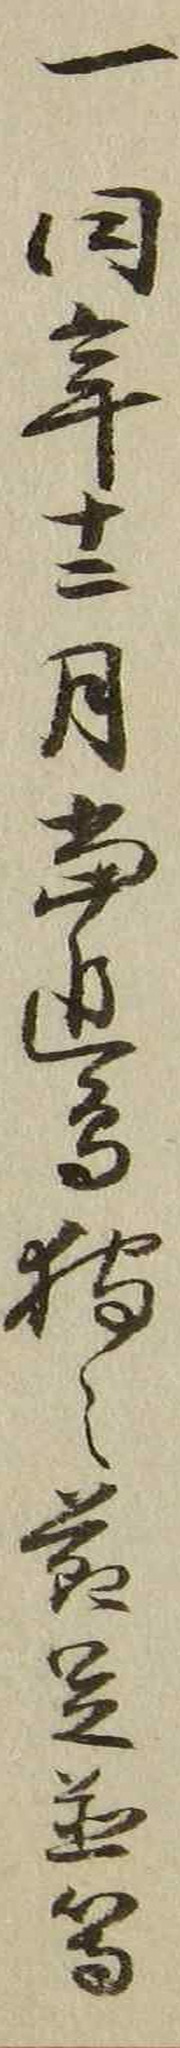一同年十二月当追鳥狩之節足並等
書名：諸士系譜　巻之236　ふ之部4
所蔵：会津若松市立会津図書館
